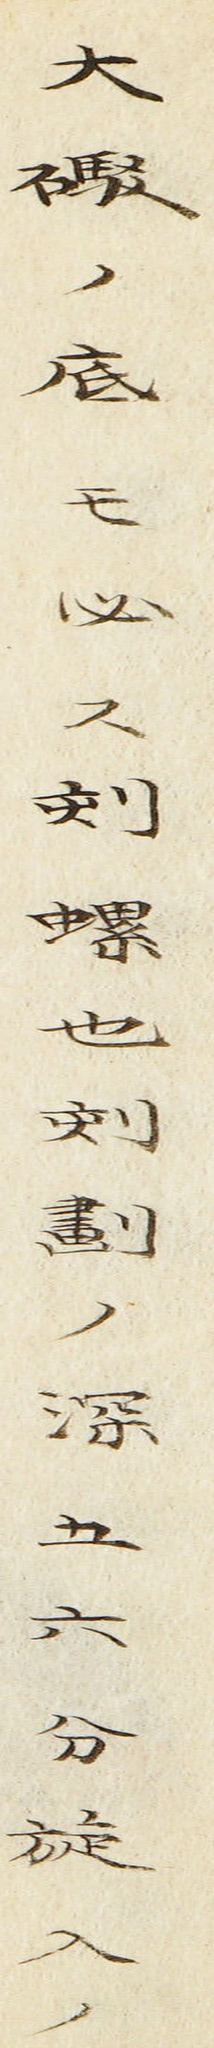〇大礟ノ底モ必ス刻螺也刻割ノ深五六分旋入ノ
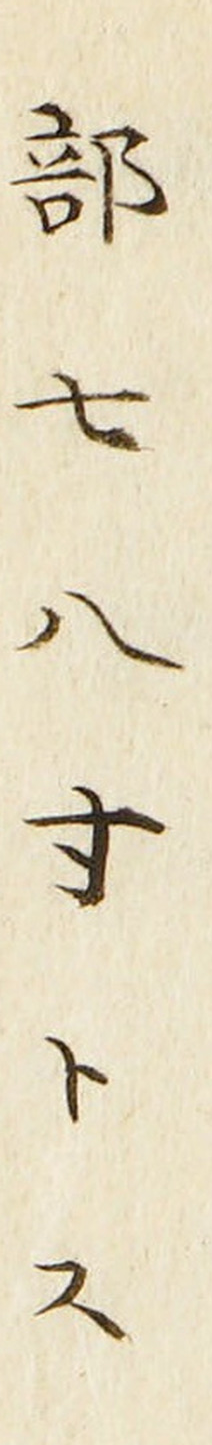部七八寸トス
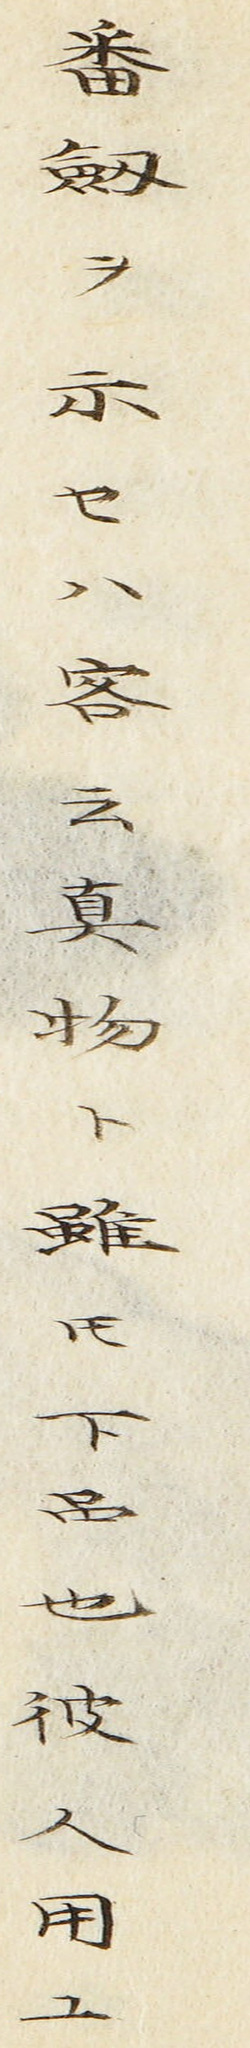〇番剣ヲ示セハ客云真物ト雖トモ下品也彼人用ユ
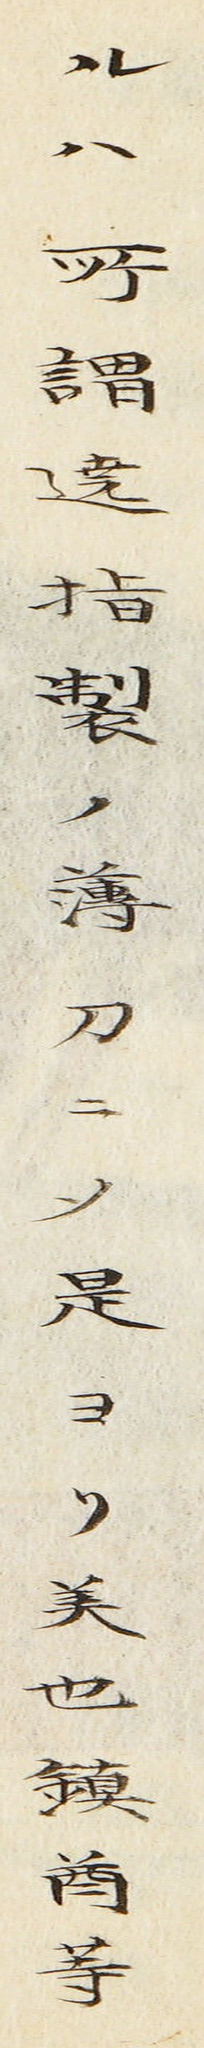ルハ所謂遶指製ノ薄刀ニシテ是ヨリ美也鎮酋等
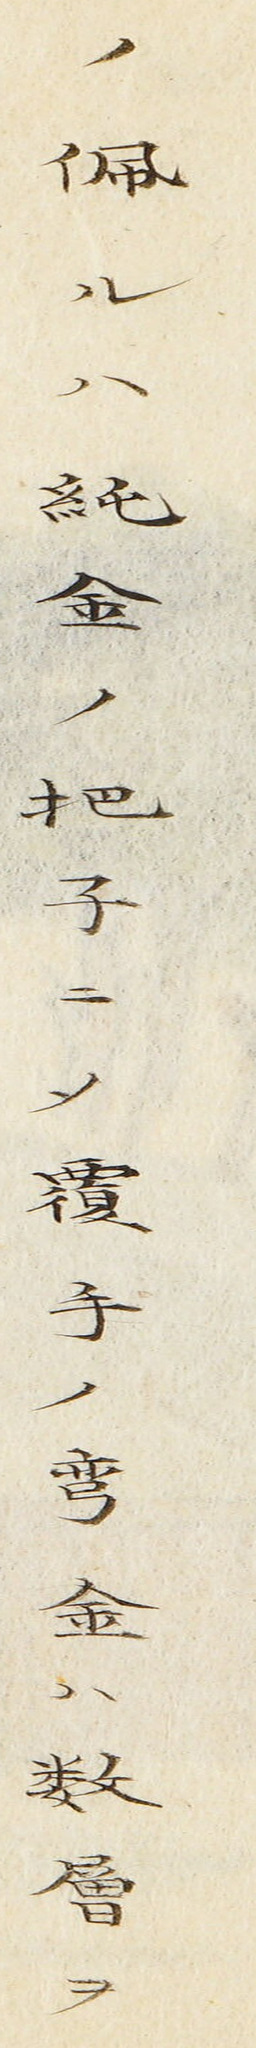ノ佩ルハ純金ノ把子ニシテ覆手ノ弯金ハ数層ヲ
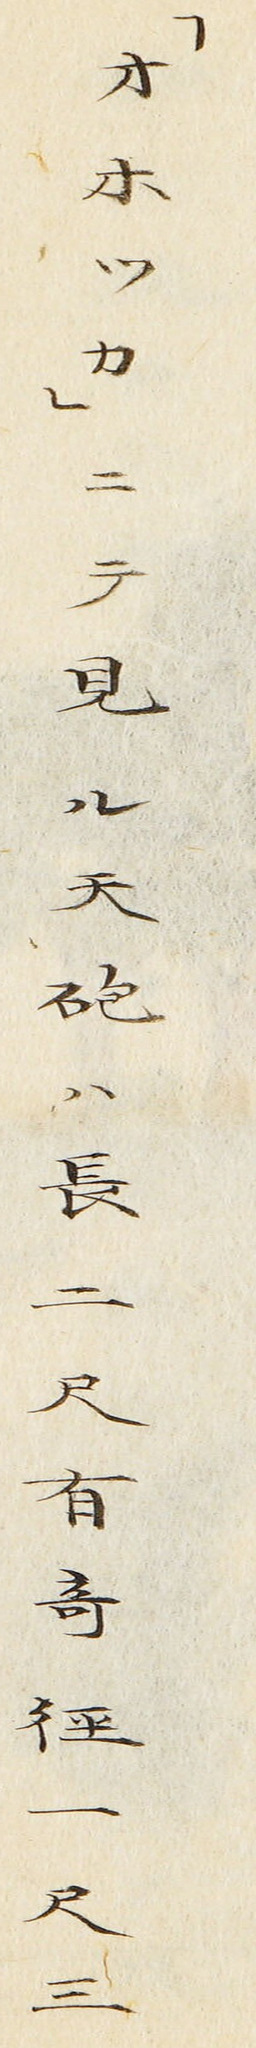〇「オホツカ」ニテ見ル天砲ハ長二尺有奇圭径一尺三
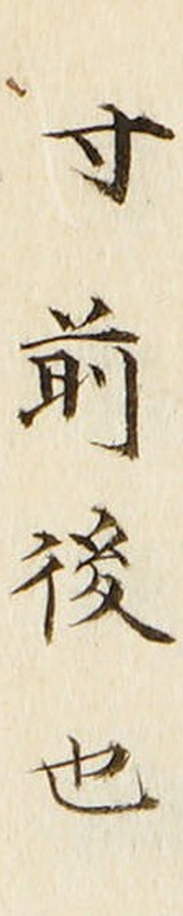寸前後也
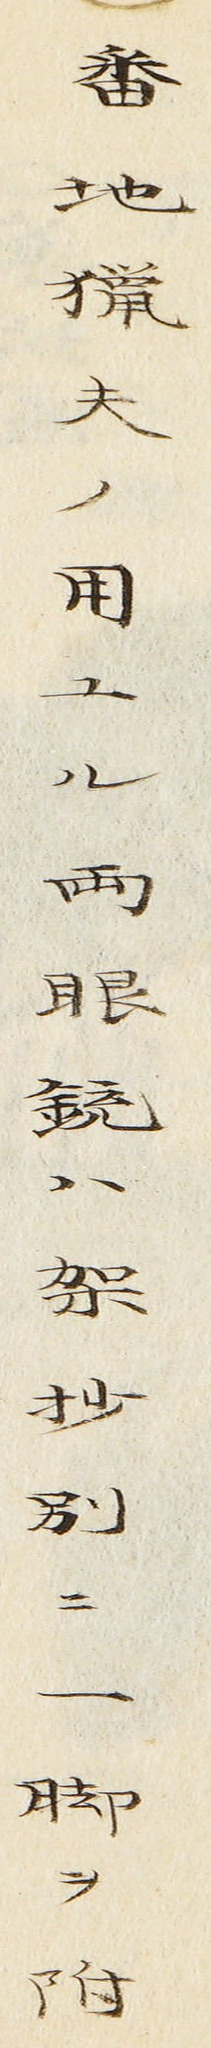〇番地了し猟夫ノ用ユル両眼銃ハ架抄別ニ一脚ヲ附
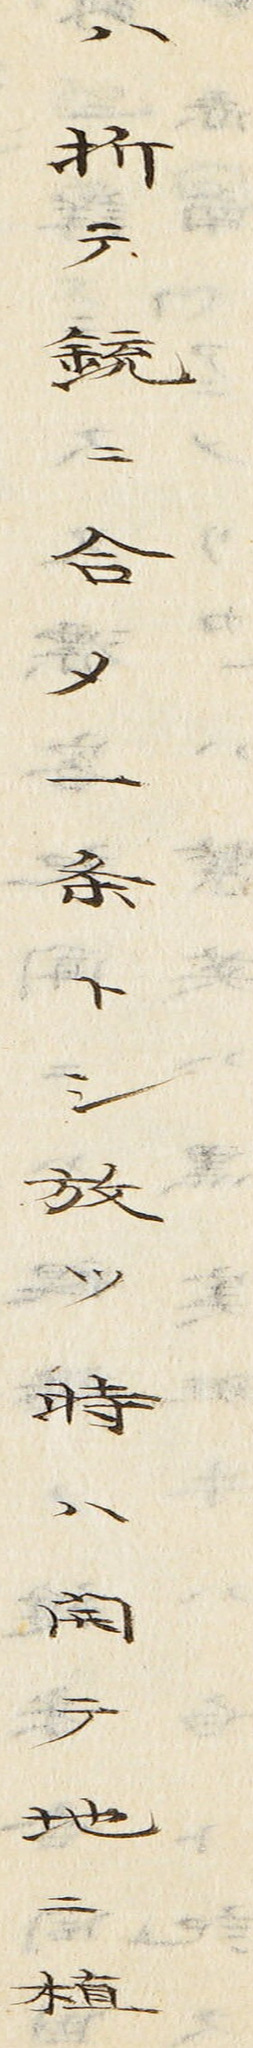ハ折テ銃ニ合シテ一条トシ放ツ時ハ開テ地ニ植
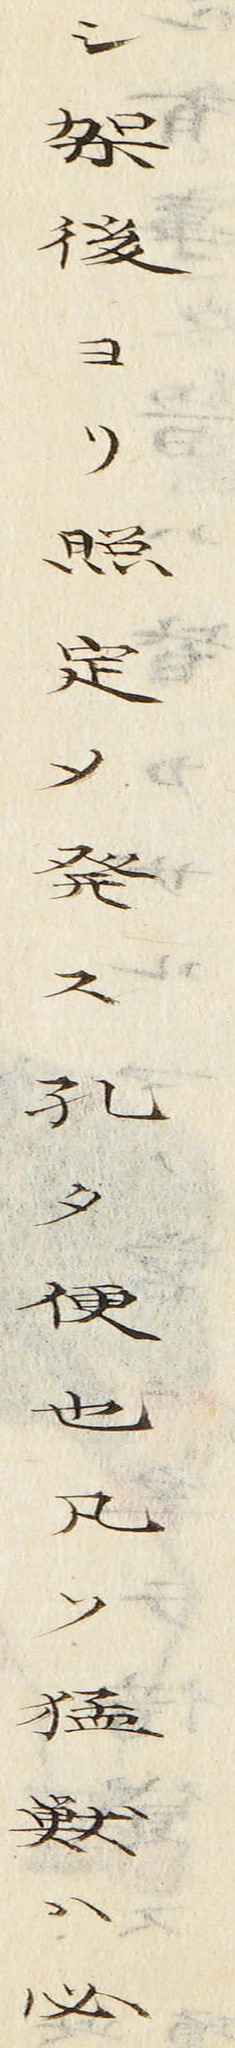シ架後ヨリ照定シテ発ス孔タ便也凡ソ猛獣ハ必
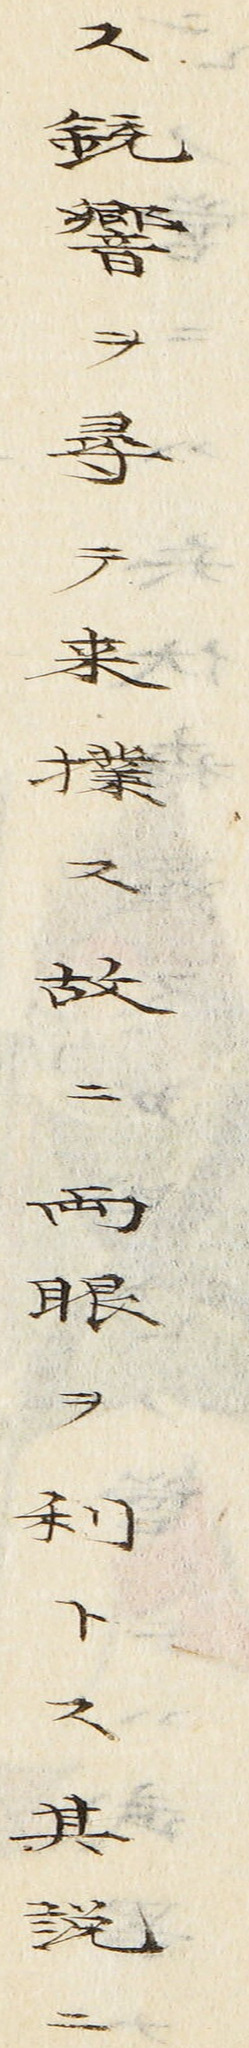ス銃響ヲ尋テ来撲ス故ニ両眼ヲ利トス其説ニ
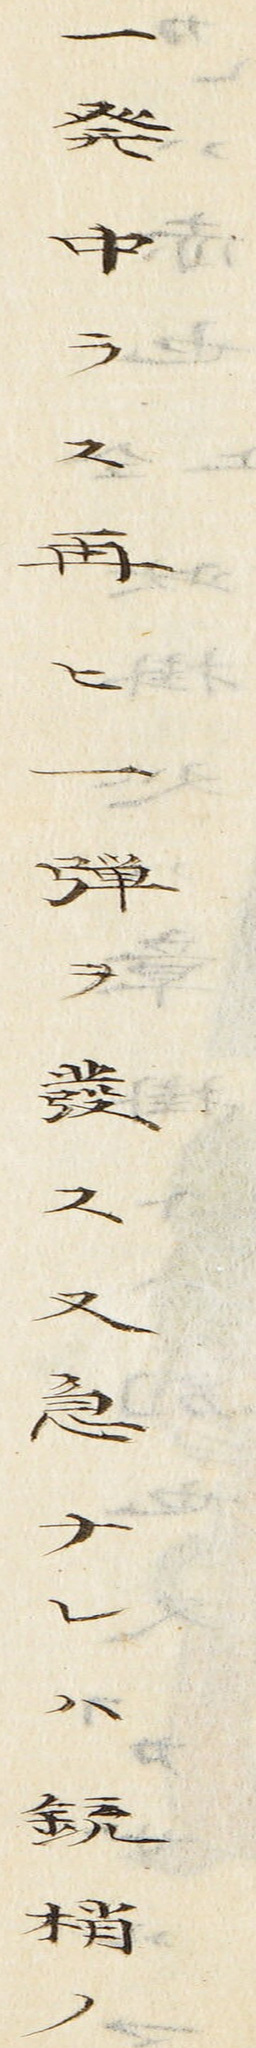一発中ラス再ヒ一弾ヲ発ス又急ナレハ銃梢ノ
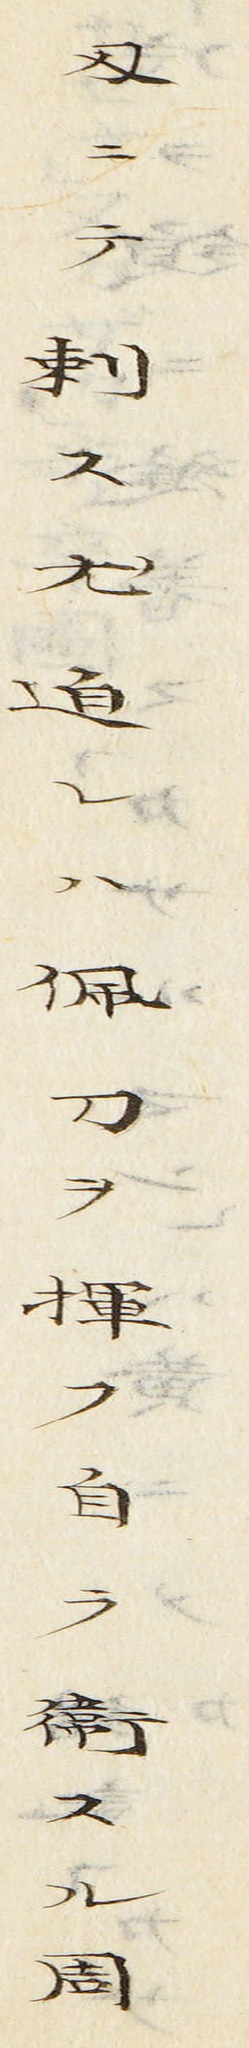刃ニテ刺ス尤迫レハ佩刀ヲ揮フ自ラ衛スル周
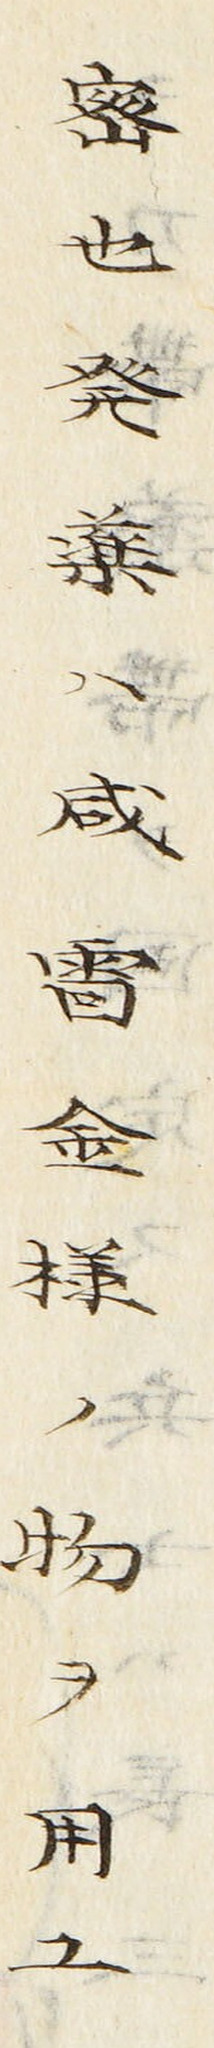密也発薬ハ咸雷金様ノ物ヲ用ユ
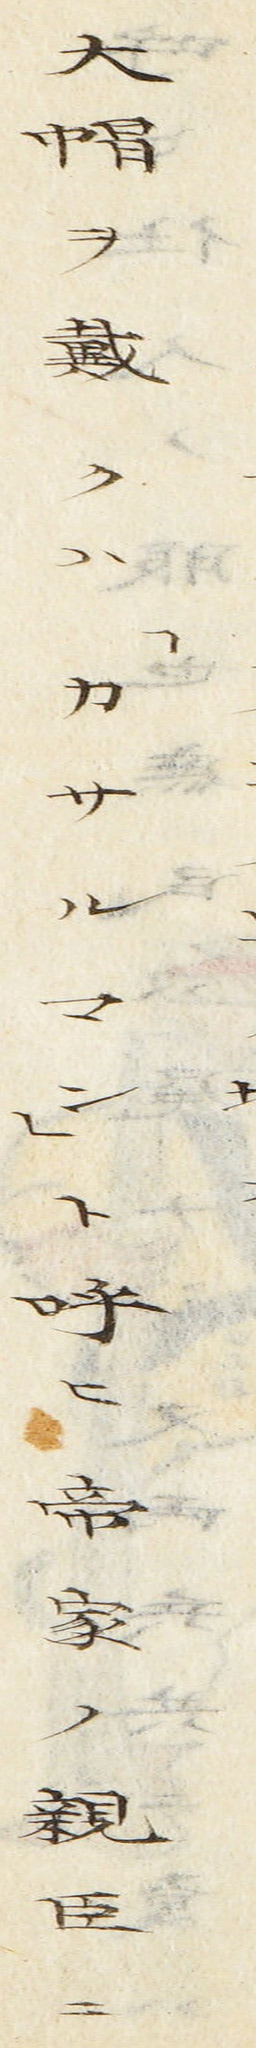大帽ヲ戴クハ「カサルマン」ト呼ヒ帝家ノ親臣ニ
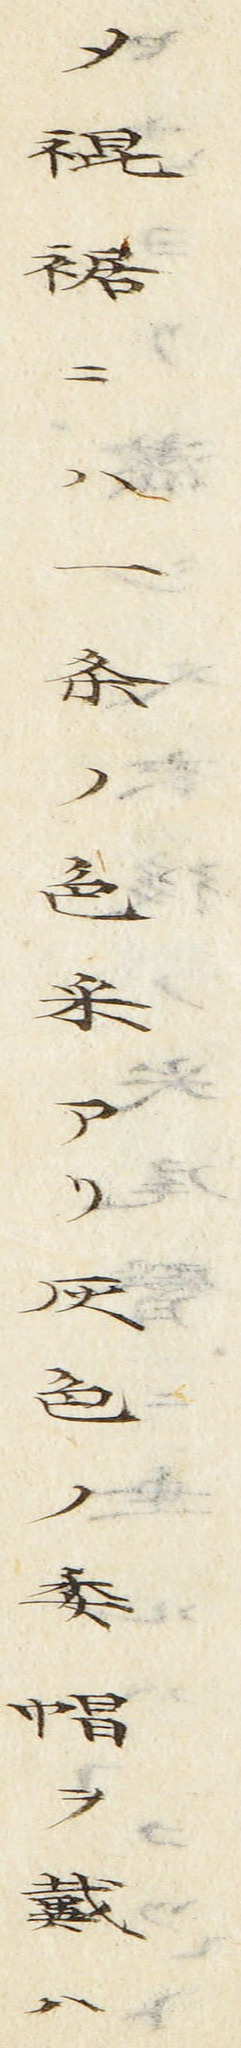シテ裩裾ニハ一条ノ色采アリ灰色ノ委帽ヲ戴ハ
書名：蕃談
